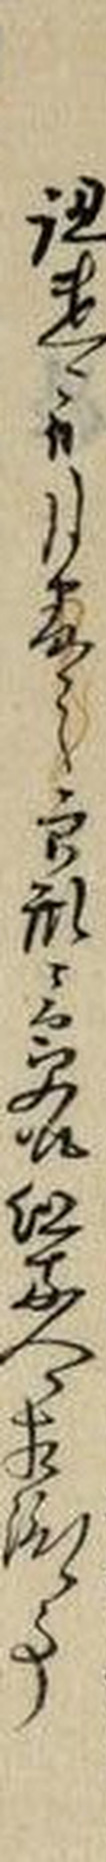認遣候ニ付月番之印形ニ而受取組両人へ相渡候事
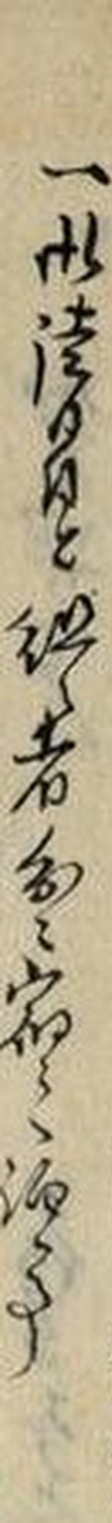一御徒目付と組之者分々宿々へ泊候事
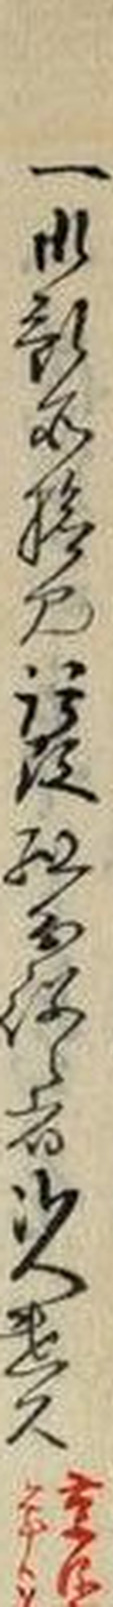一御預所検見跡改組分役之者弐人遣ス
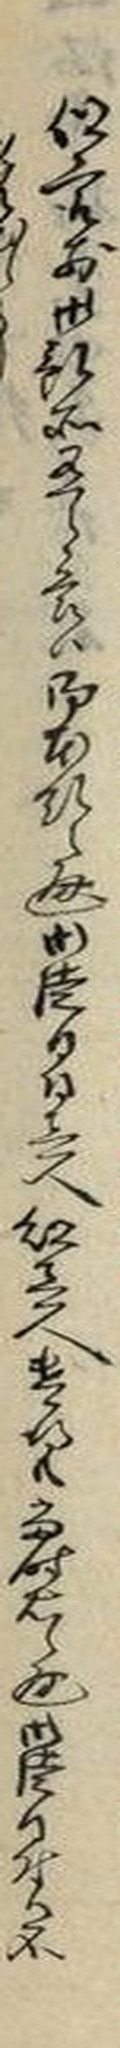但最前御預所有之候節ハ御本領之通御徒目付壱人組壱人遣候得共当時右之通御徒目付ハ不
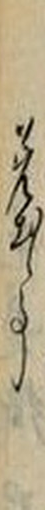差出候事
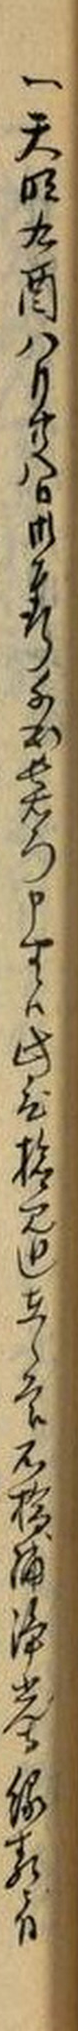一天明九酉八月廿八日御奉行千本長左衛門申聞候ハ此度検見廻在之節石橋浦浄光寺縁類ニ付
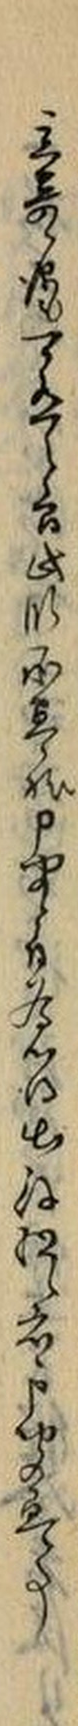立寄候儀も可有之候間此段承置候様申聞候ニ付為心得出役組之者へ申聞置候事
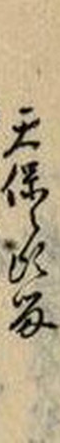天保之頃留
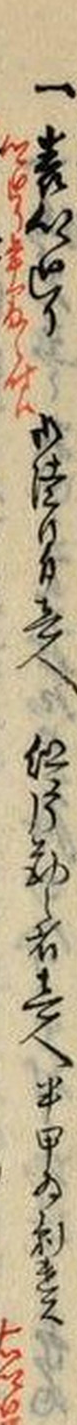一表郷廻り御徒目付壱人組片勤之者壱人半甲為剃遣ス
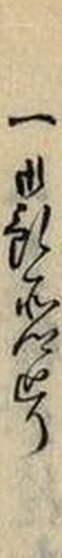一御預所郷廻り
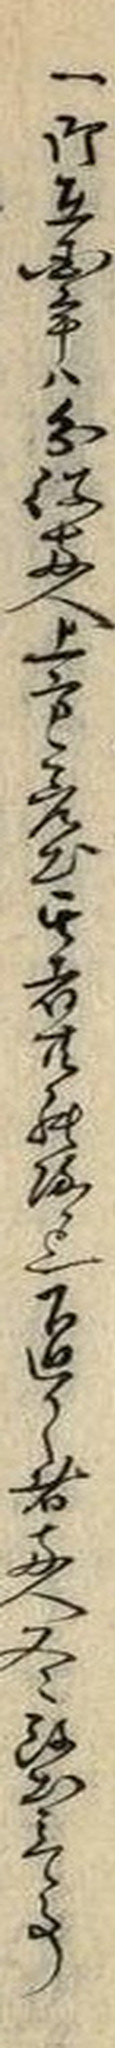一御在国年ハ分役両人上方へ差出其者共罷帰候上下回り之者両人又々致出立候事
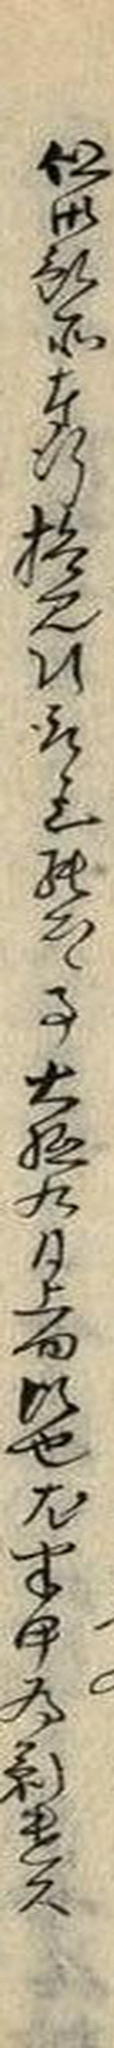但御預所奉行検見引取候上罷出候事大極九月上旬頃也尤半甲為剃遣ス
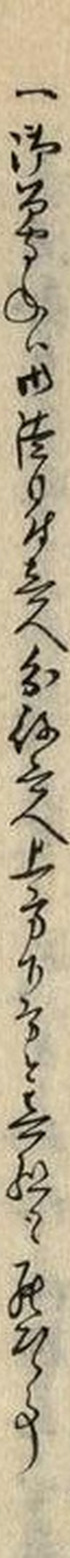一御留守年ハ御徒目付壱人分役壱人上方下方と壱組ツヽ罷出候事
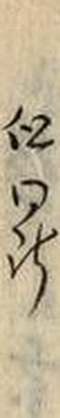但同断
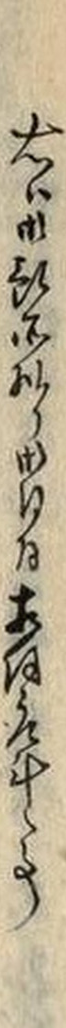右ハ御預所掛り御目付相伺取計候事
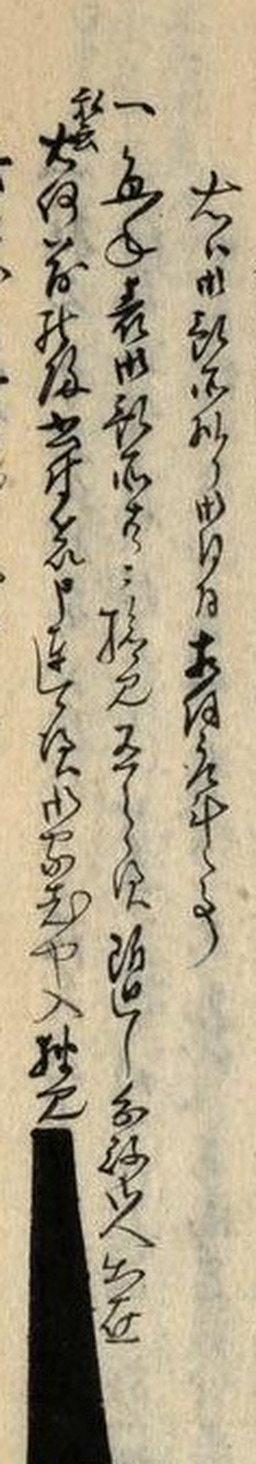一毎年表御預所共ニ検見有之候得ハ附廻し分役弐人出在
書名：御国他国諸事之部
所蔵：福井県文書館 Fukui Prefectural Archives
